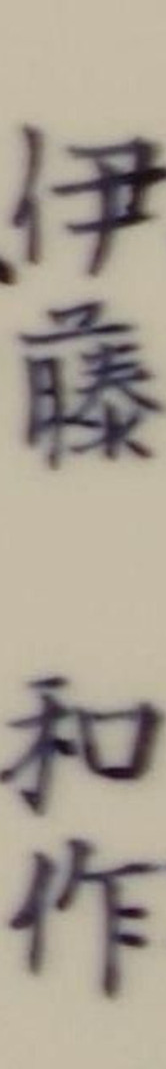伊藤和作
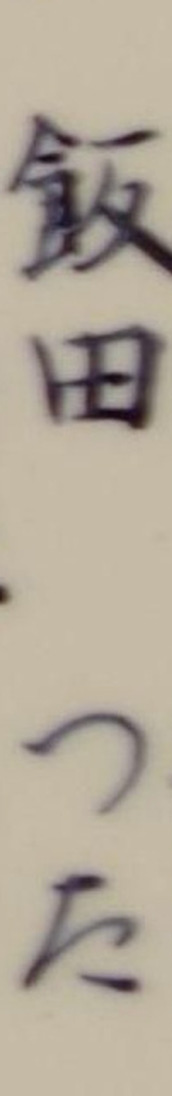飯田つた
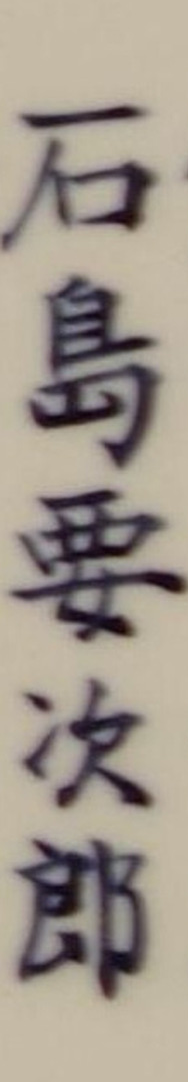石島要次郎
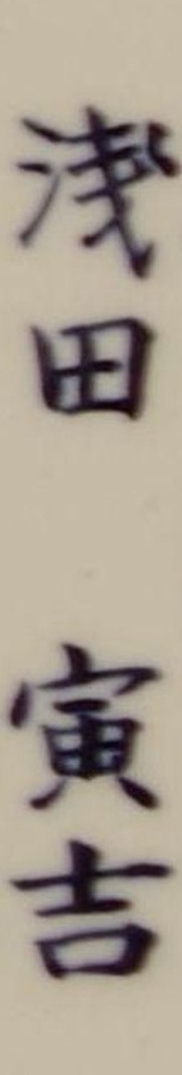浅田寅吉
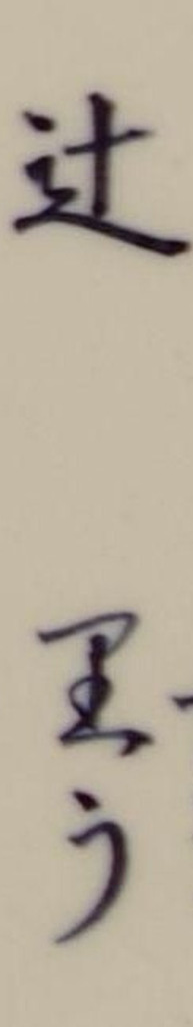辻りう
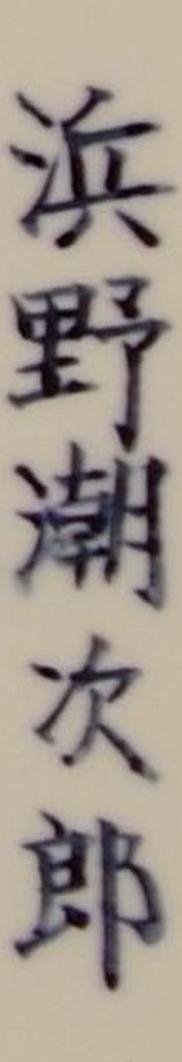浜野潮次郎
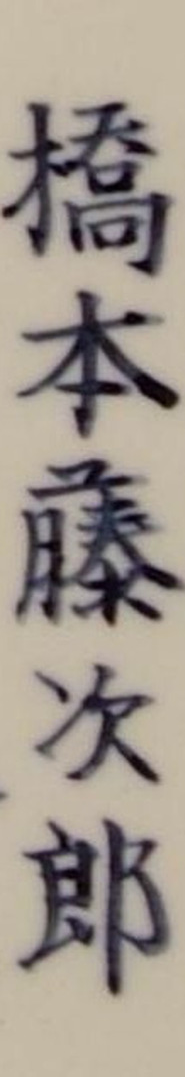橋本藤次郎
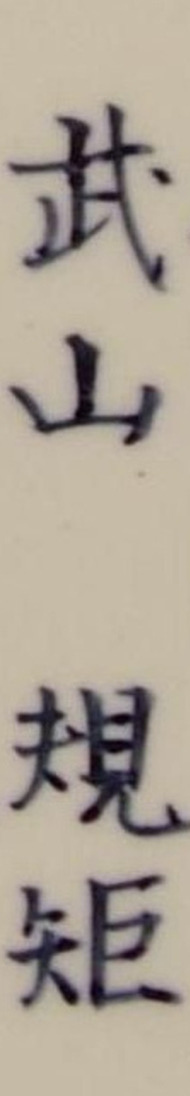武山規矩
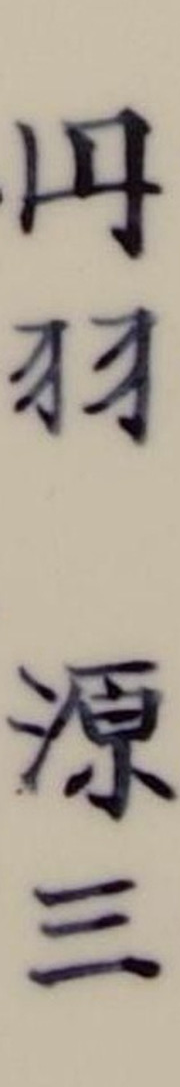円羽源三
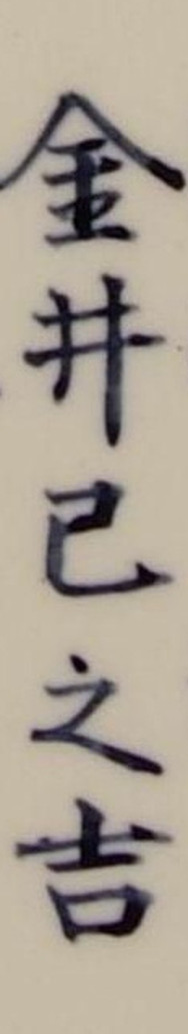金井己之吉
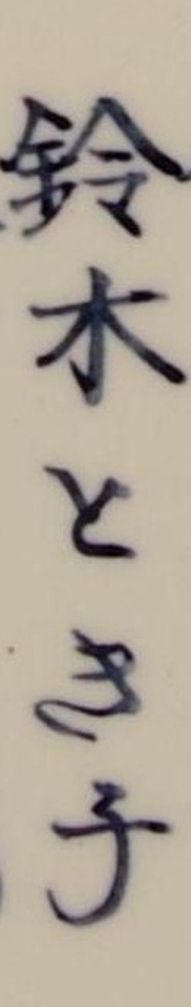鈴木とき子
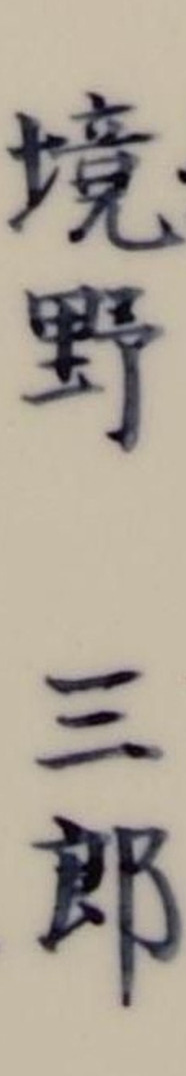境野三郎
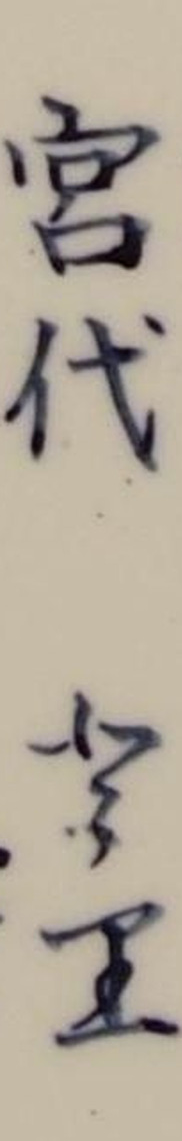宮代とり
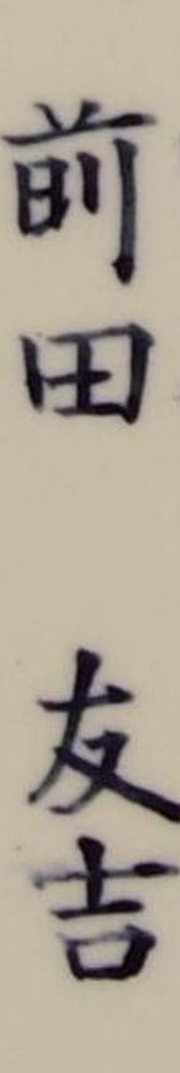前田友吉
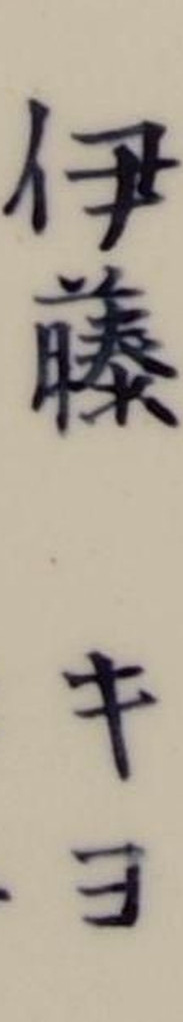伊藤キヨ
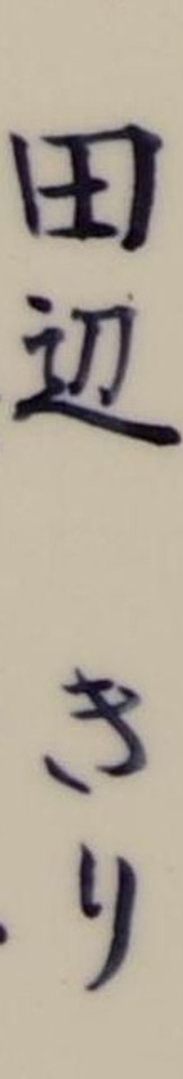田辺きり
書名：M~S
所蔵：高野山金剛峯寺
